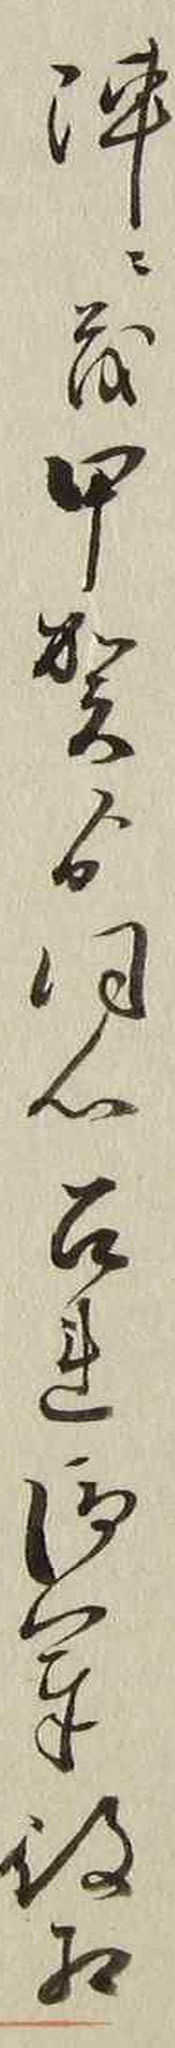陣ニも甲賀ゟ同心召連御軍役相
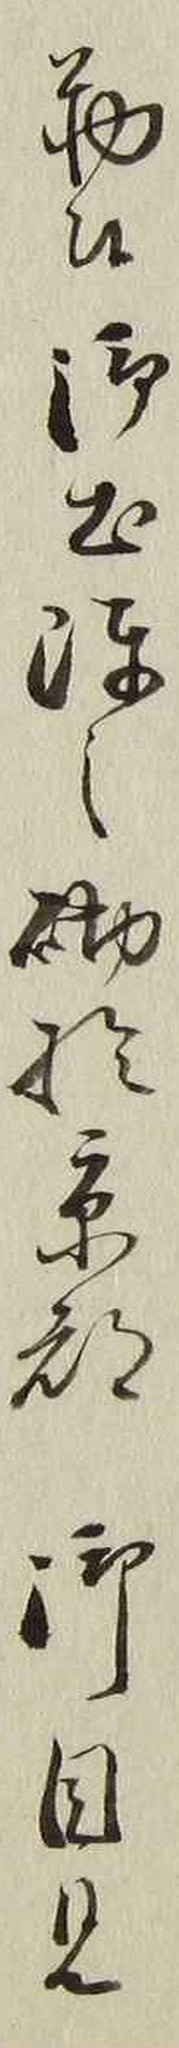勤候御出陣之砌於京都御目見
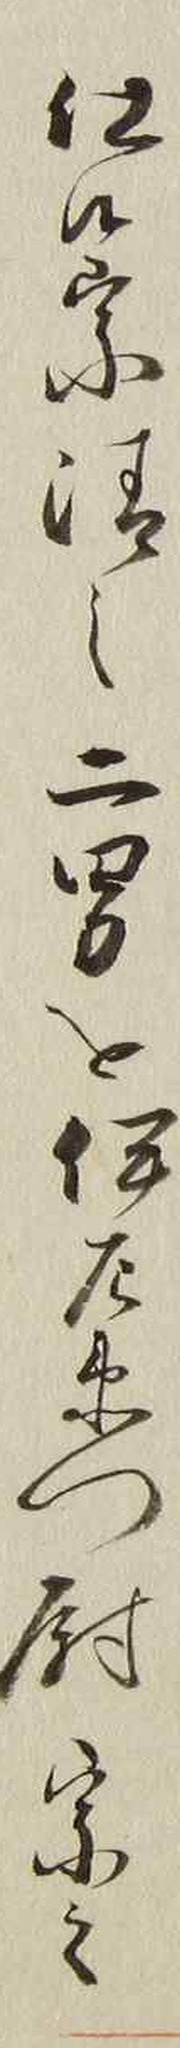仕候宗清之二男を伊左衛門尉宗之
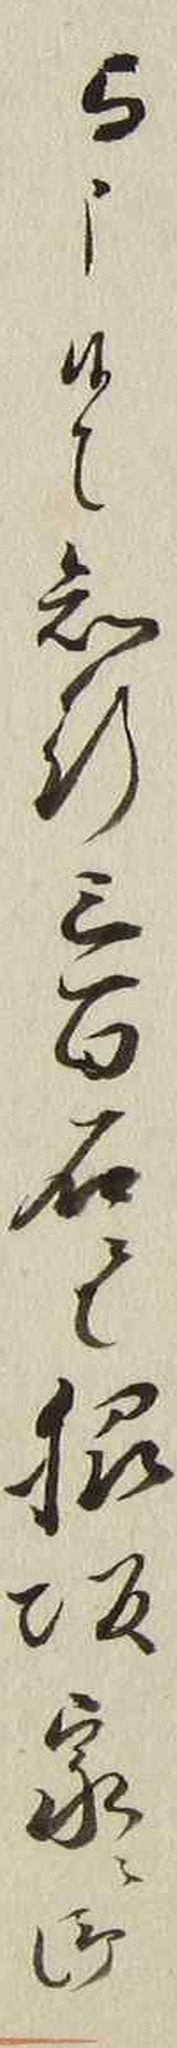と申候は知行三百石ニて脇坂家ニ御
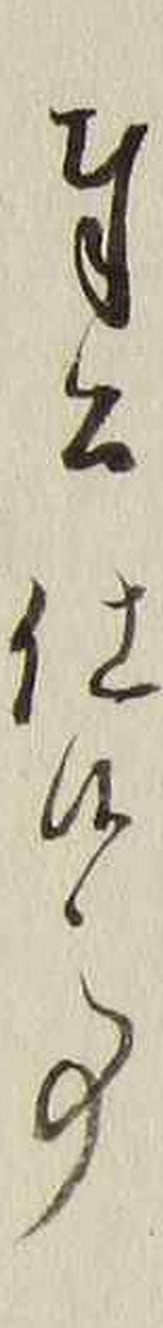奉公仕候事

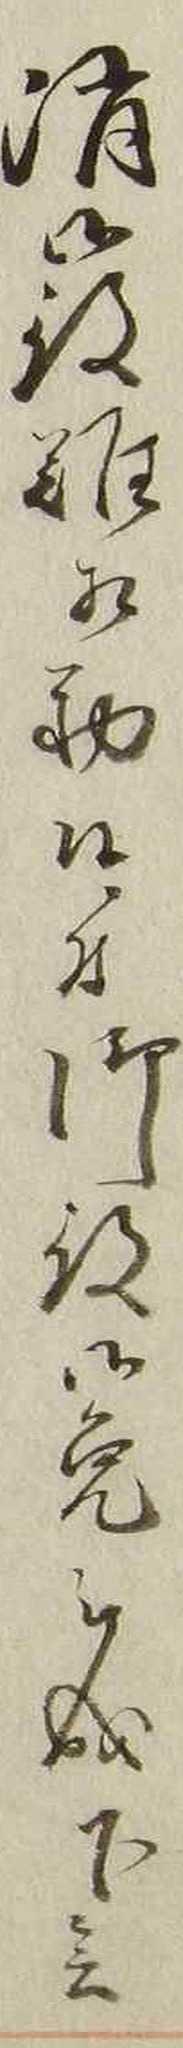消御役難相勤候ニ付御役御免被成下会
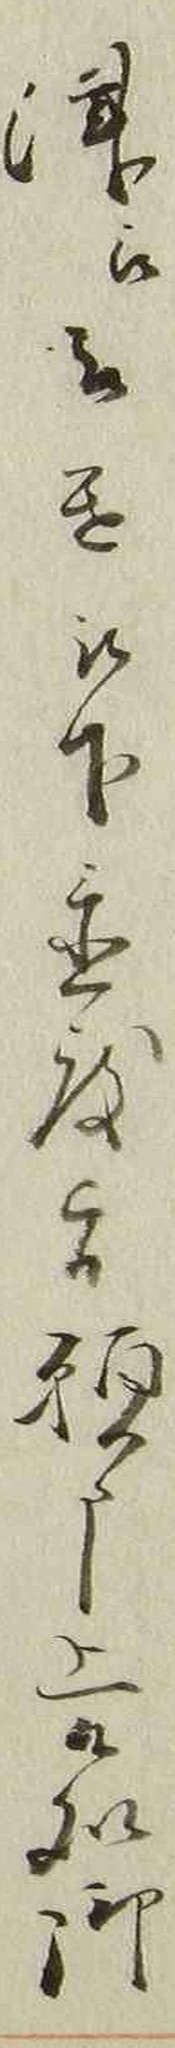津江被遣被下置度旨願申上候処御
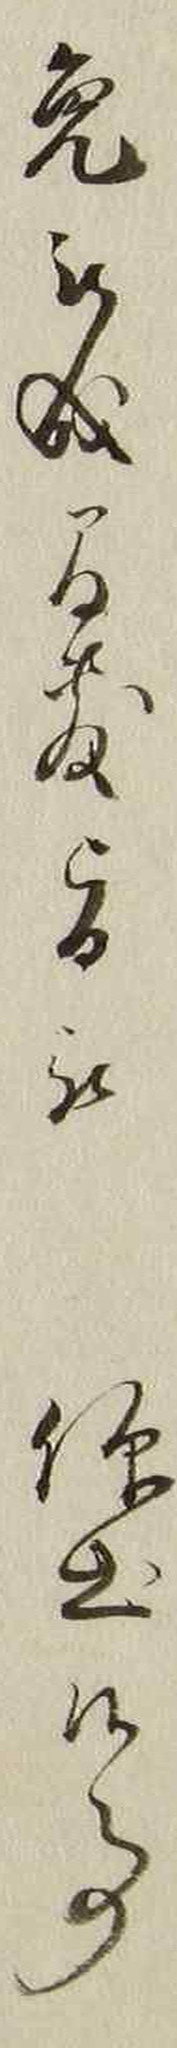免被成間敷旨被仰出候事
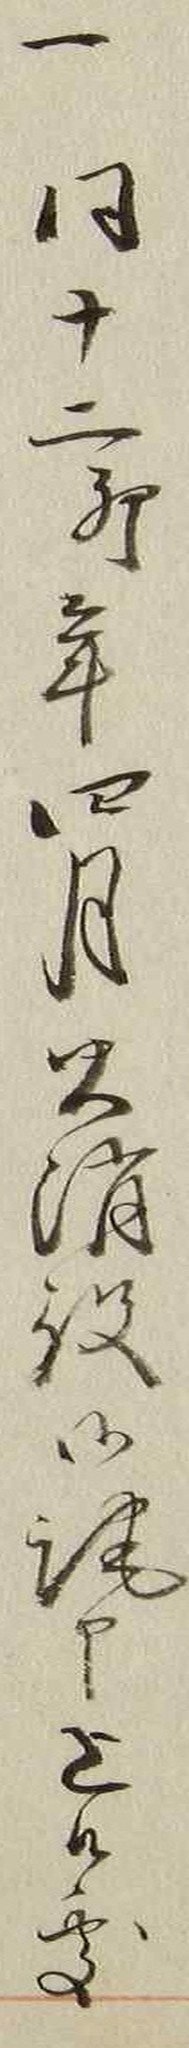一同十二卯年四月火消役御詫申上候処
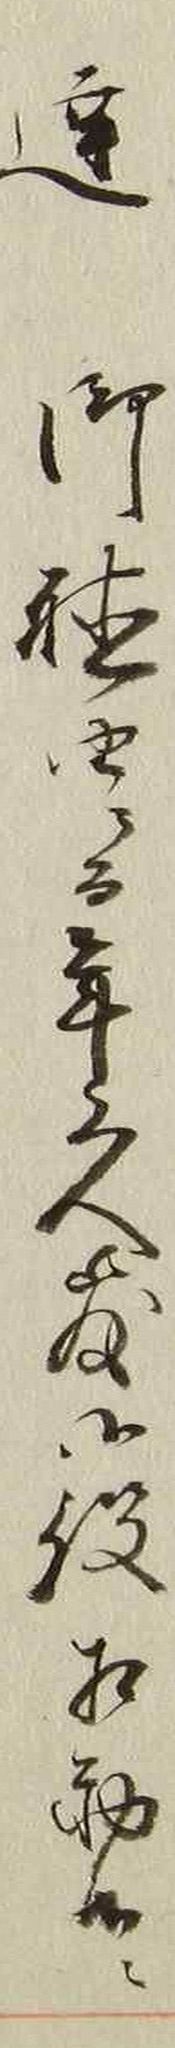達御聴由ニ而年久敷御役相勤候ニ
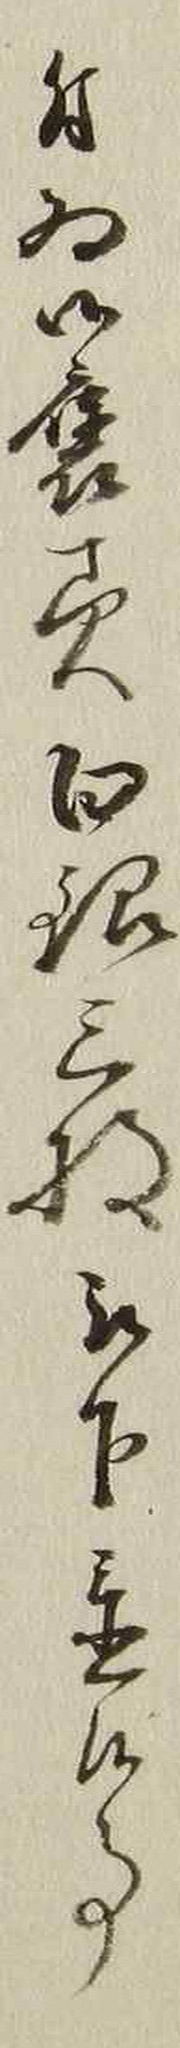付為御褒美白銀三枚被下置候事
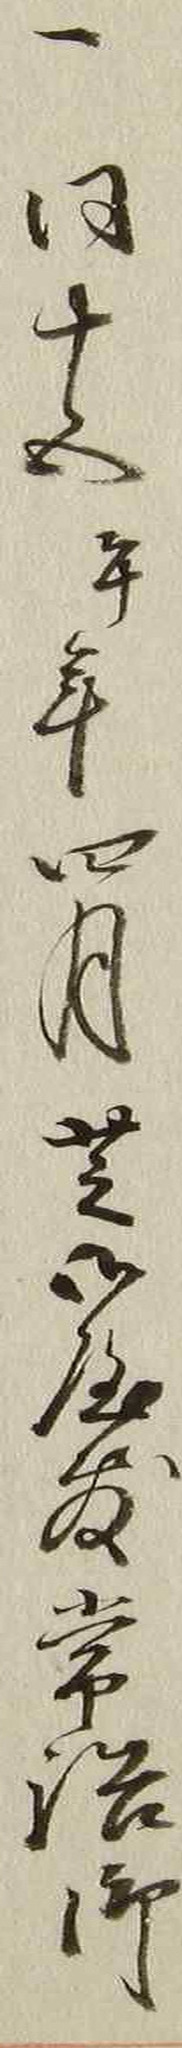一同十五午年四月芝御屋敷常詰御
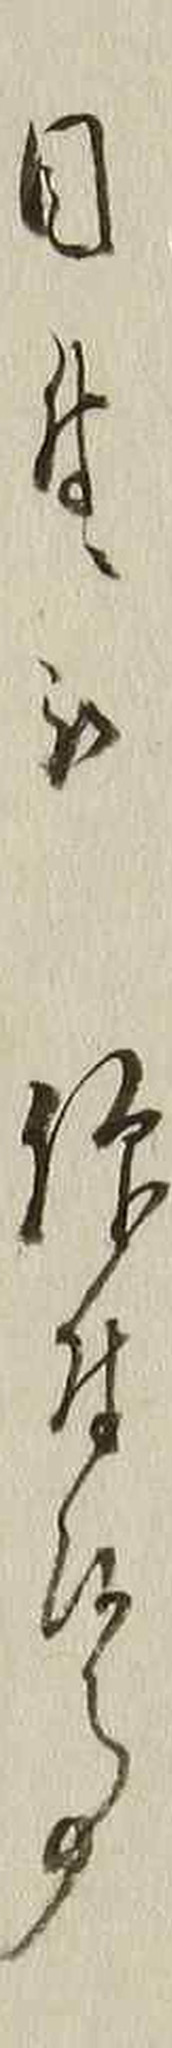目付ニ被仰付候事
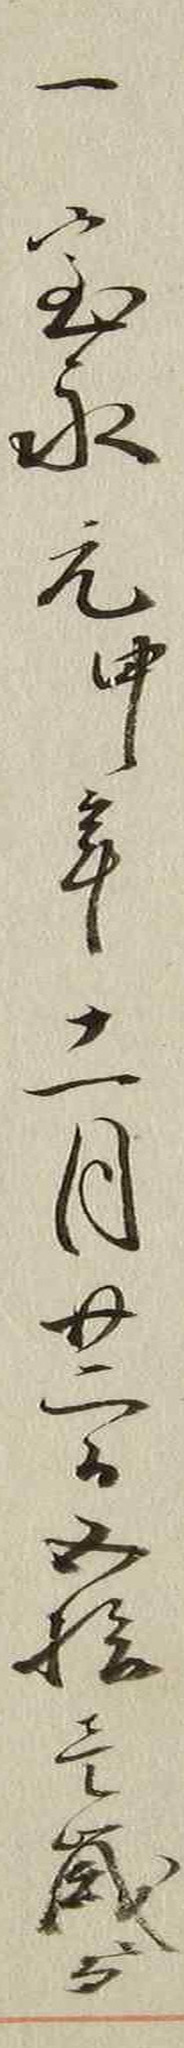一宝永元申年十一月廿二日五拾壱歳ニ而
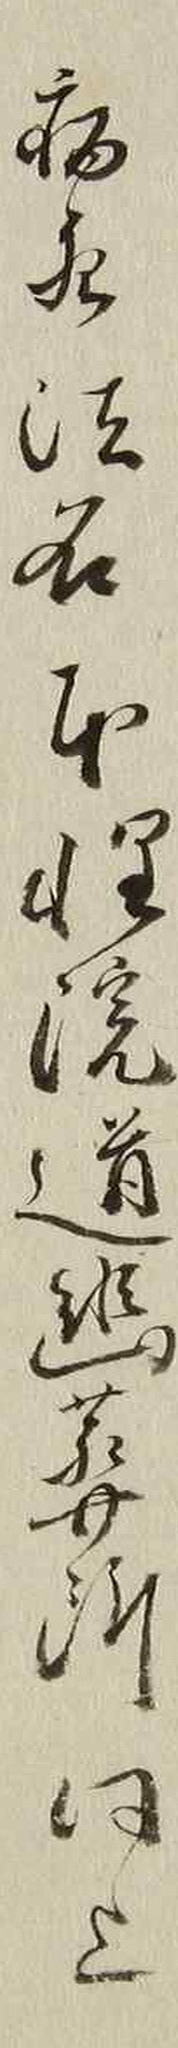病死法名本惶院道幽葬所同上
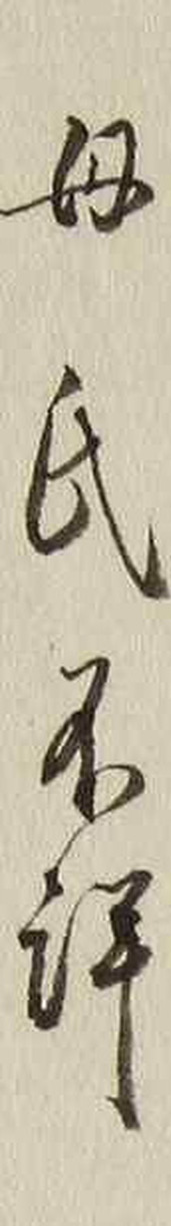母氏不詳
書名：諸士系譜　巻之141　た之部17
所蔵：会津若松市立会津図書館
